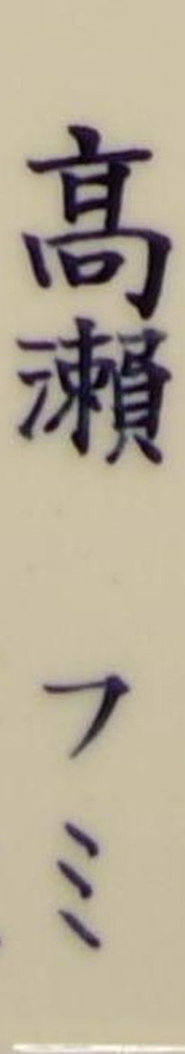高瀬フミ
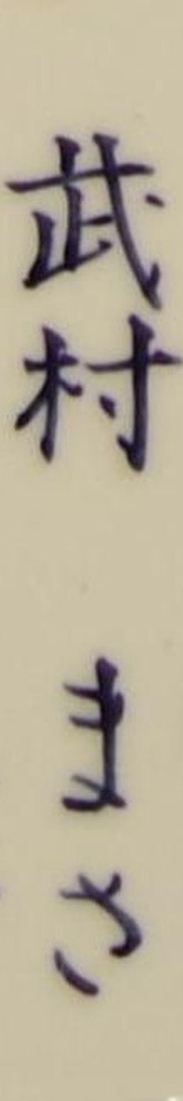武村まさ
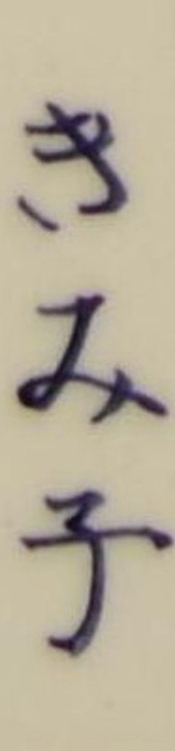きみ子
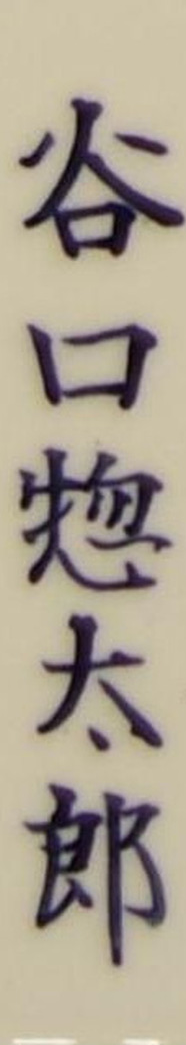谷口惣太郎
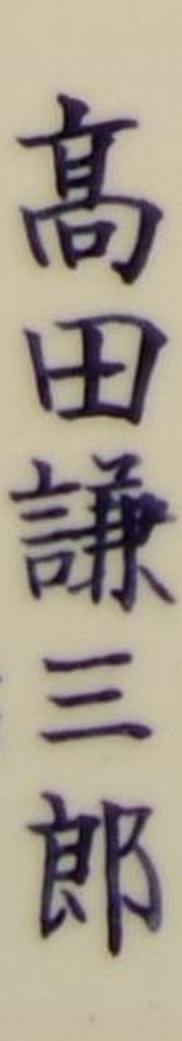高田謙三郎

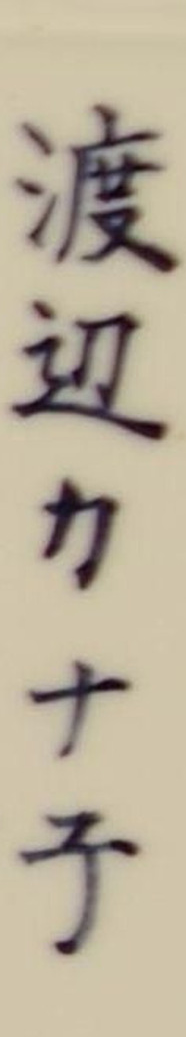渡辺カナ子
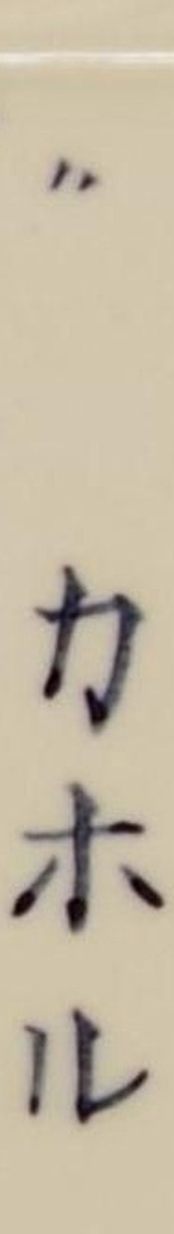カホル
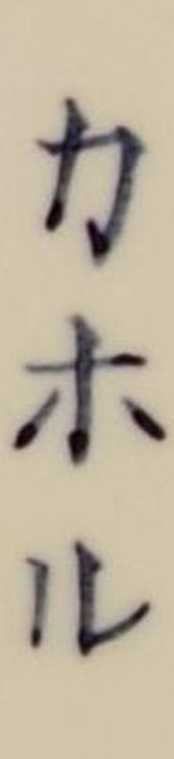カホル
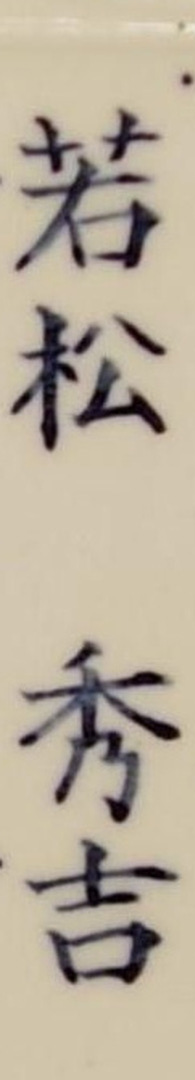若松秀吉
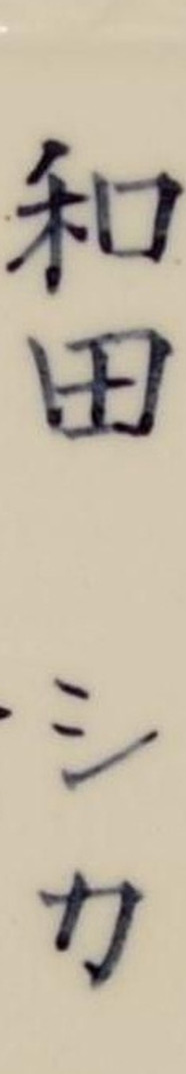和田シカ
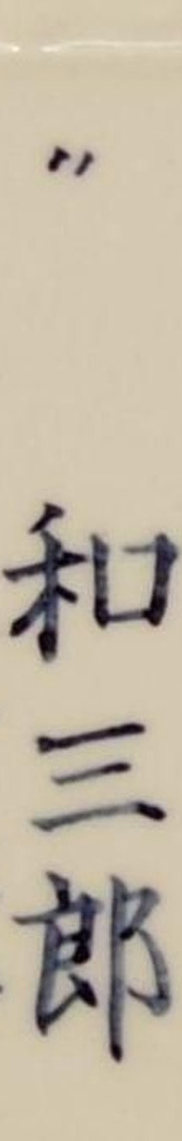和三郎
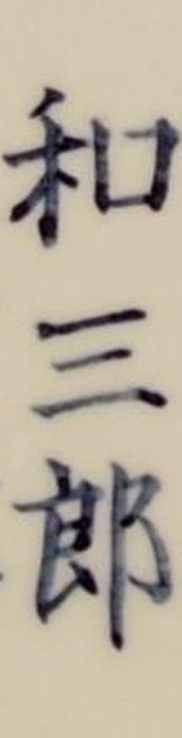和三郎
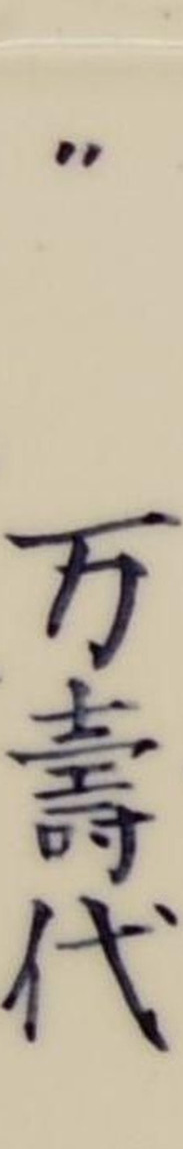万壽代
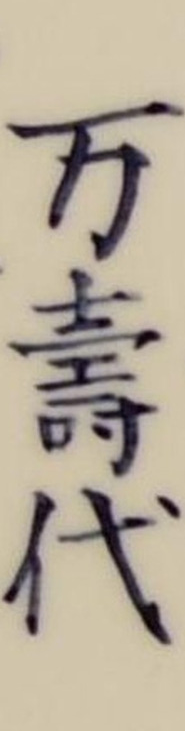万壽代
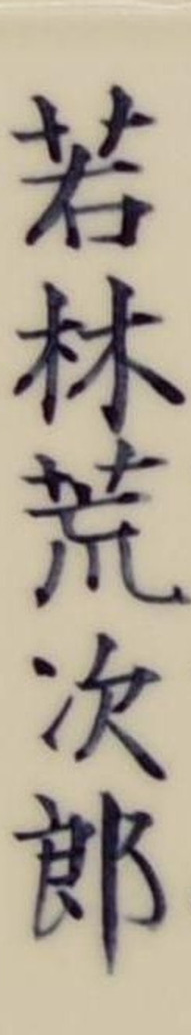若林荒次郎
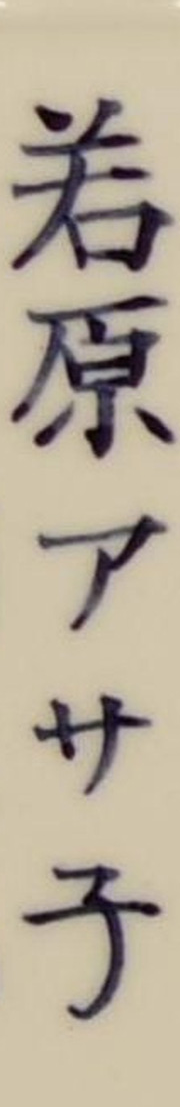若原アサ子
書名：E~L
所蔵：高野山金剛峯寺
